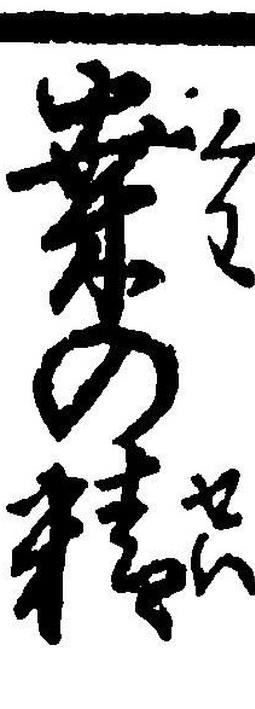桑の精

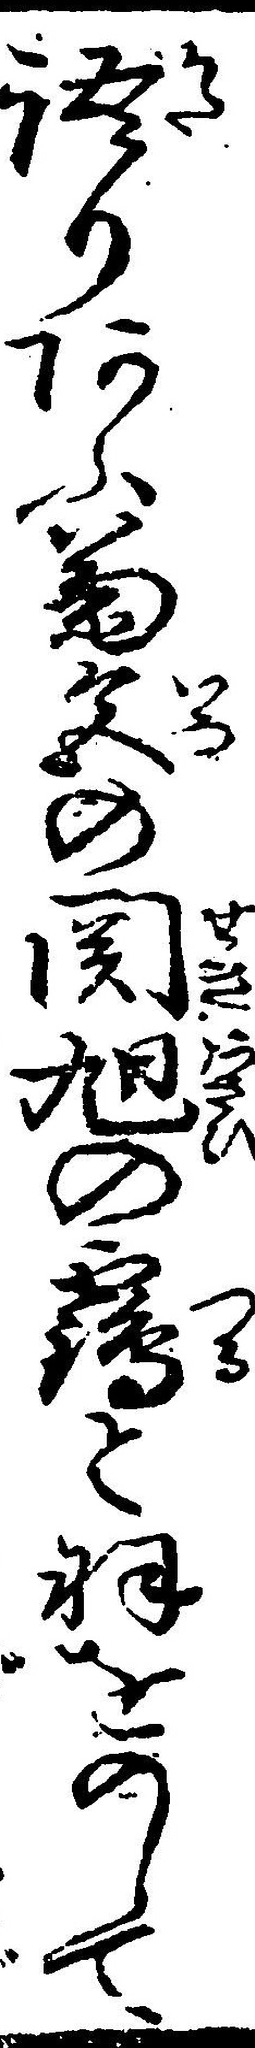語りあふ菊色の関旭の鶴と羽をのして
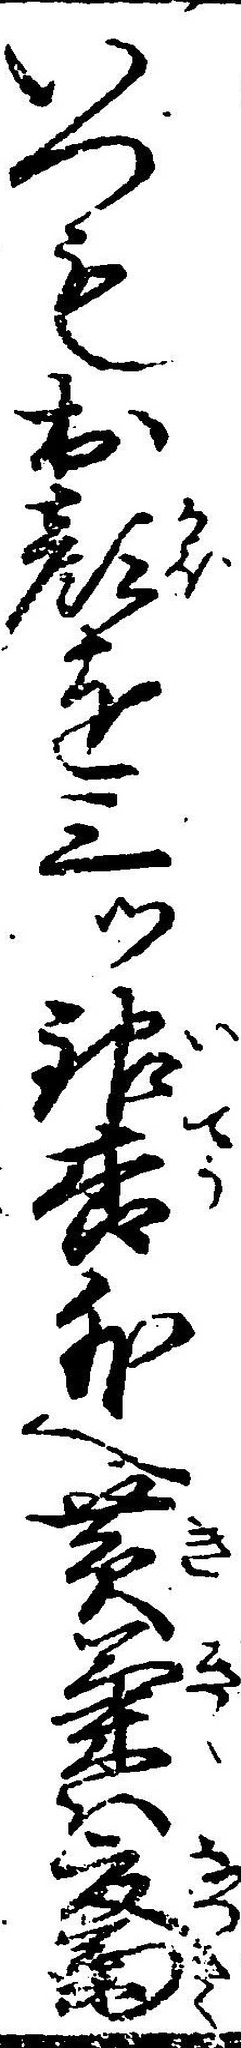いつもお顔を三ツ銀杏外へ黄菊は夏菊
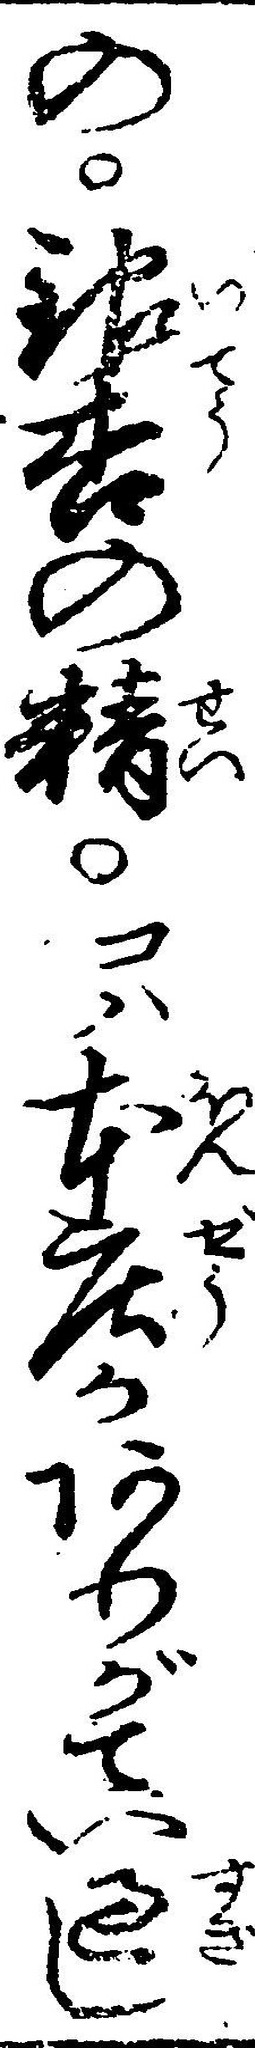の○銀杏の精○コハありがてい過し
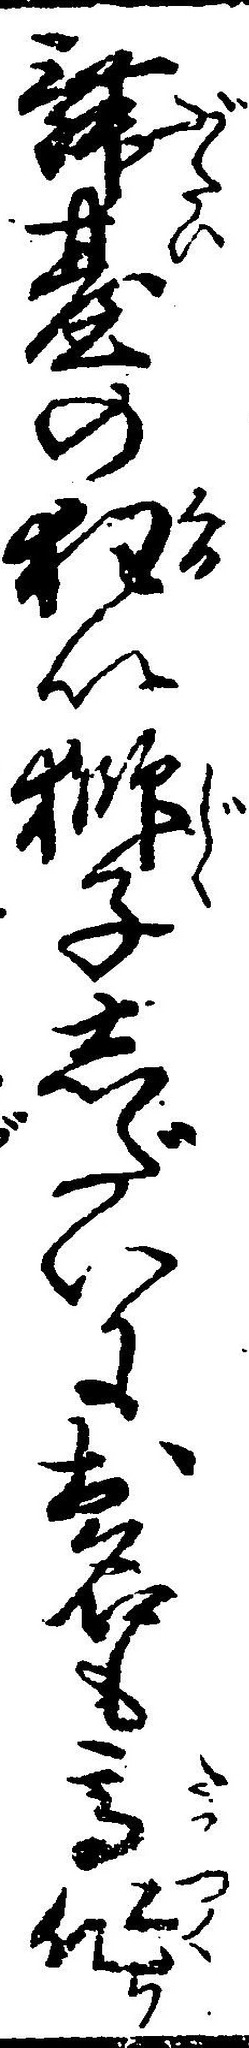舞台の狂い獅子しだいにお名も高作
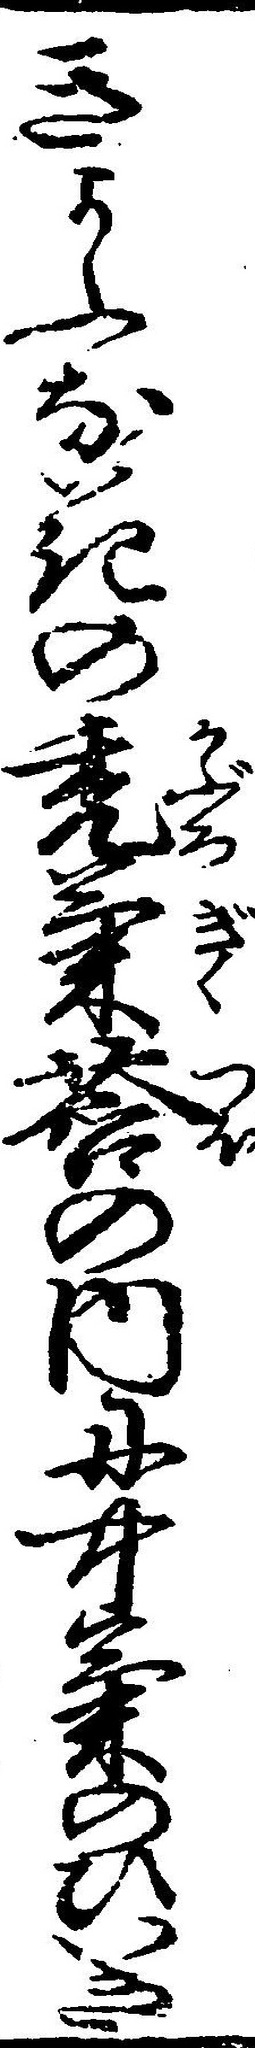きよふな花の禿菊蕾の内に中菊のひいき
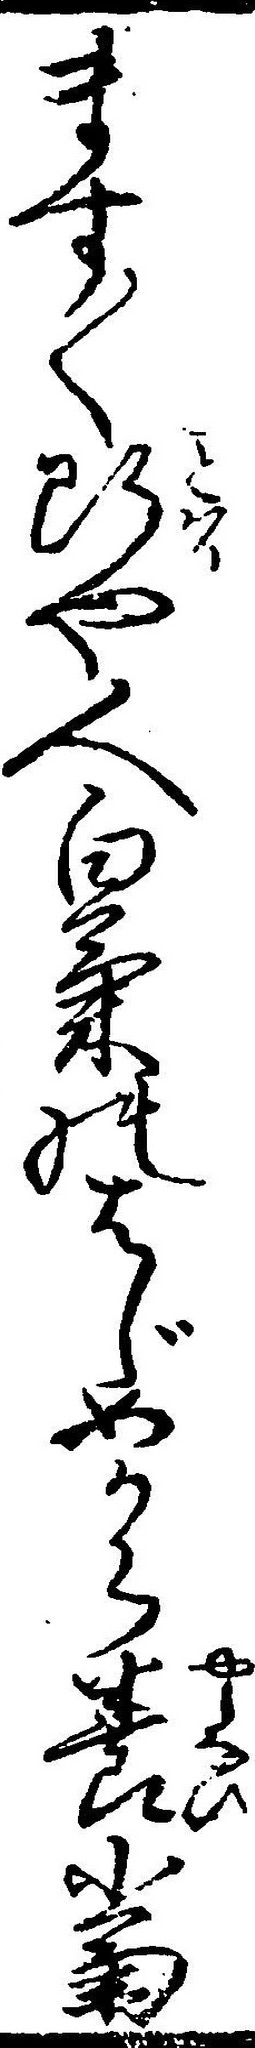ます〳〵断や人白菊のはじめから養小菊
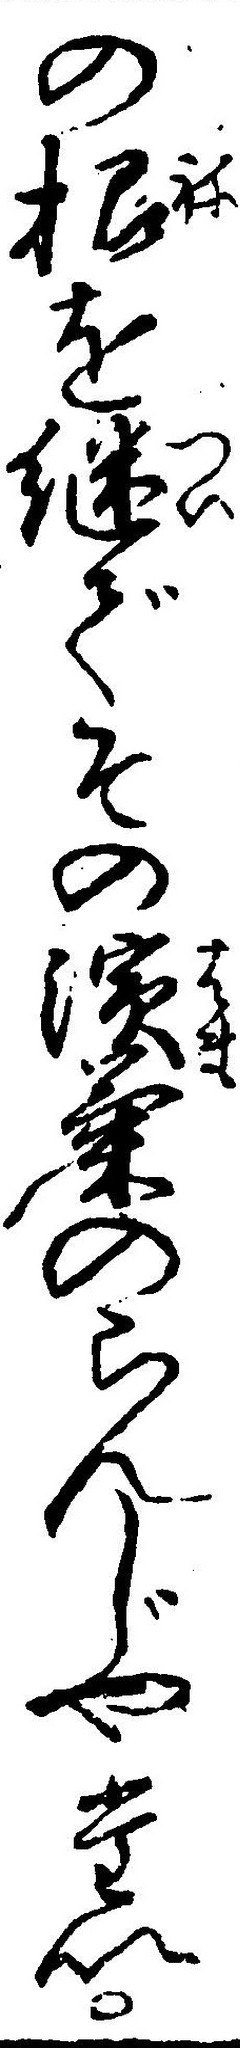の根を継でその浜菊のらんじやたい○
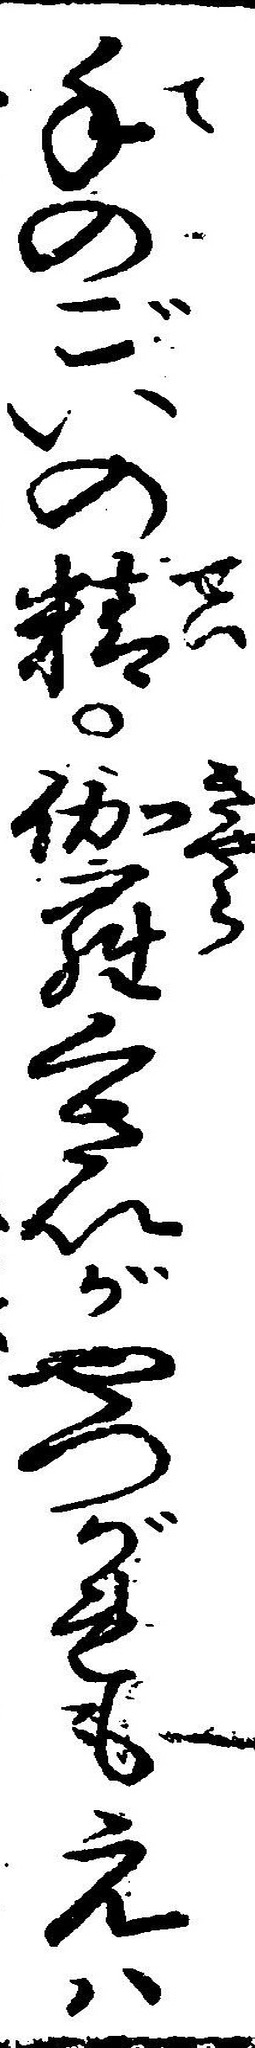手のごいの精○伽羅くさいがやつがれも元は
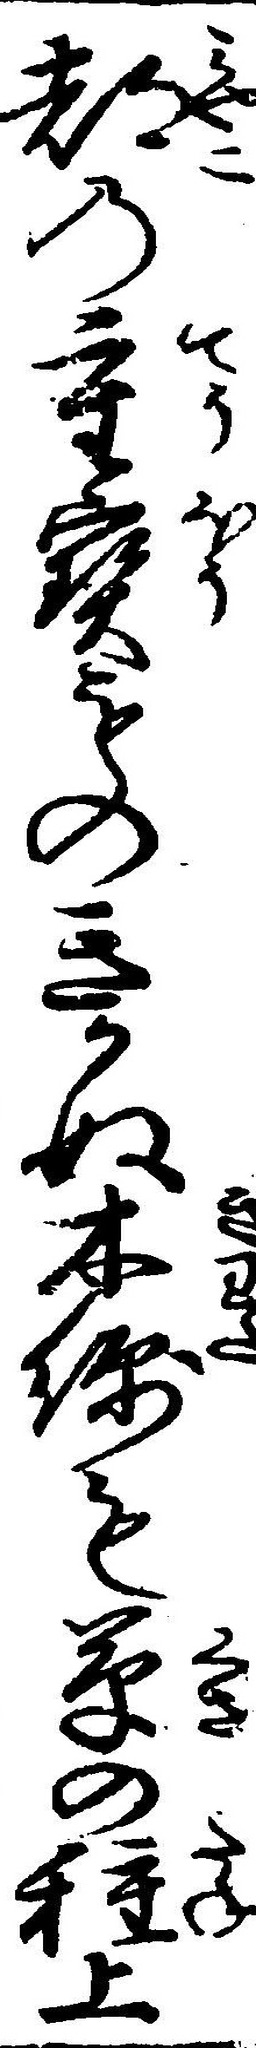都の重宝ものきかぬ木綿も草の種上
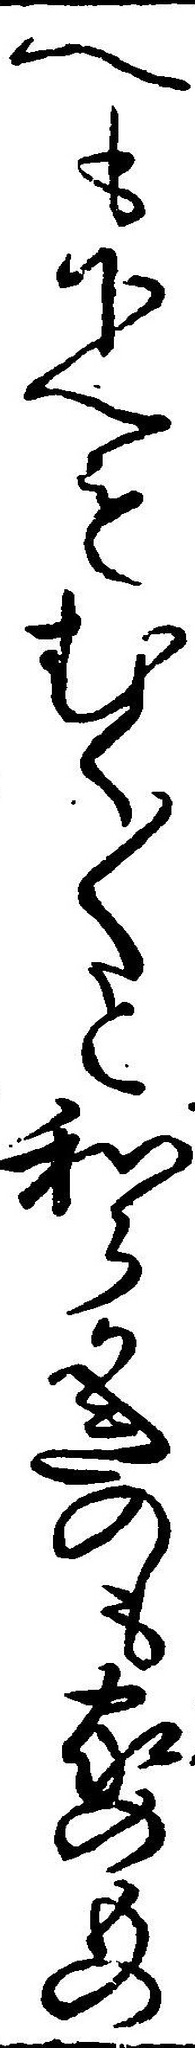へも下へもむく〳〵と和らかきのも家のもの
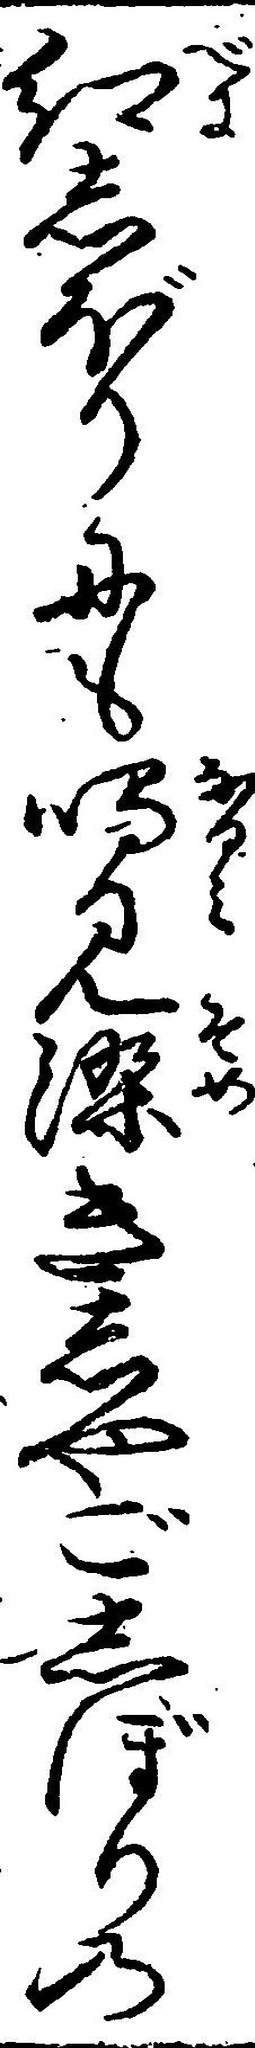紅しぼりにも鳴見染きしやごしぼりの
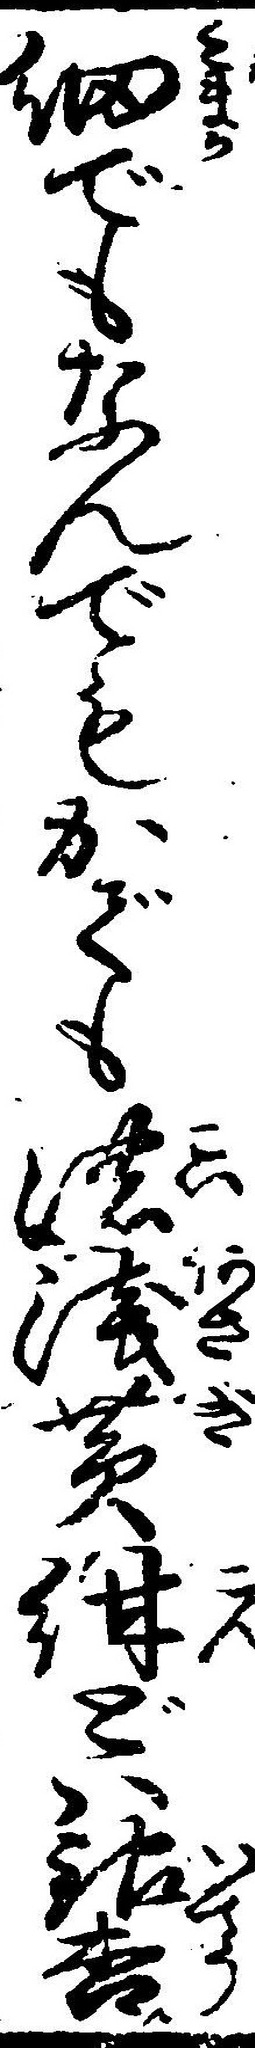細でもなんでもかでも濃浅黄紺どは銀杏
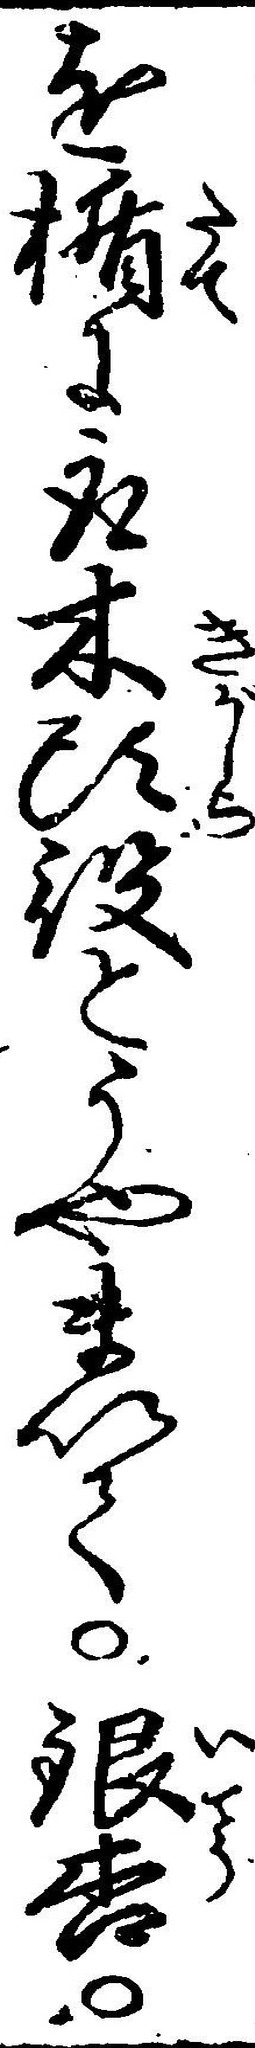を盾に取木頭役とうやまいて○銀杏○
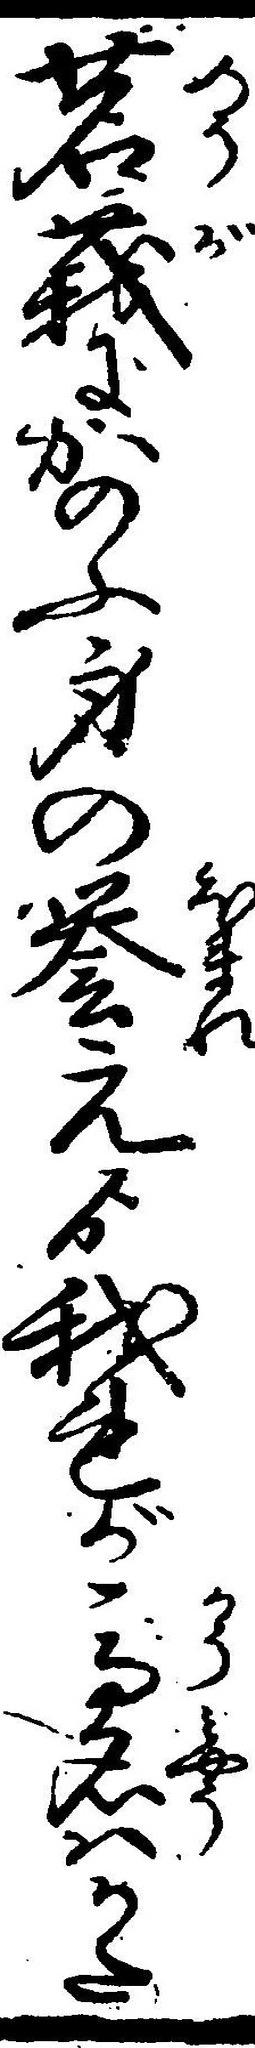茗莪にかのふ身の誉元ゟ我れが高名はかた

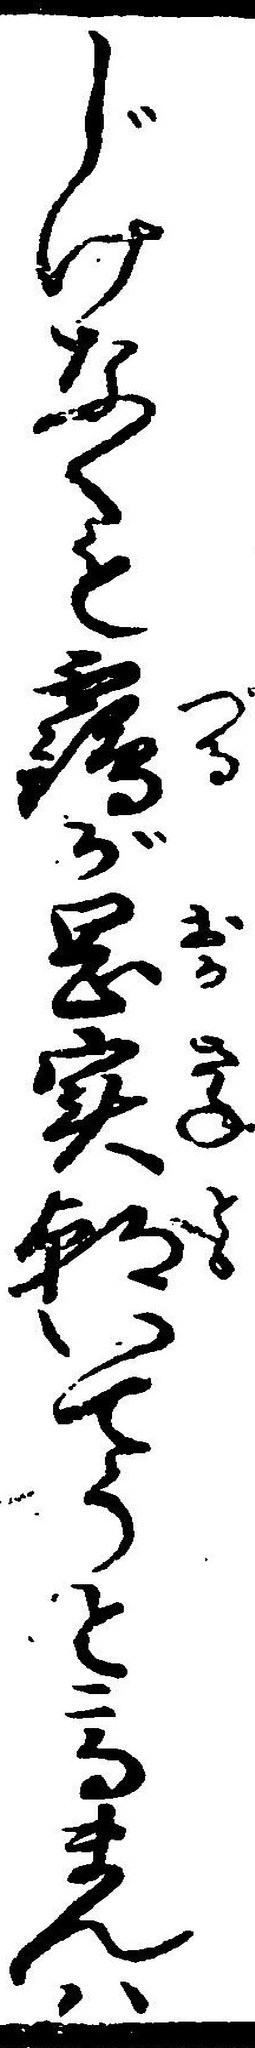じけなくと鶴が岡実朝いてうと高まんは
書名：草木芝居化物退治 / 泉花堂三蝶(十六兵衛)作
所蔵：東京大学総合図書館 General Library in the University of Tokyo, JAPAN
